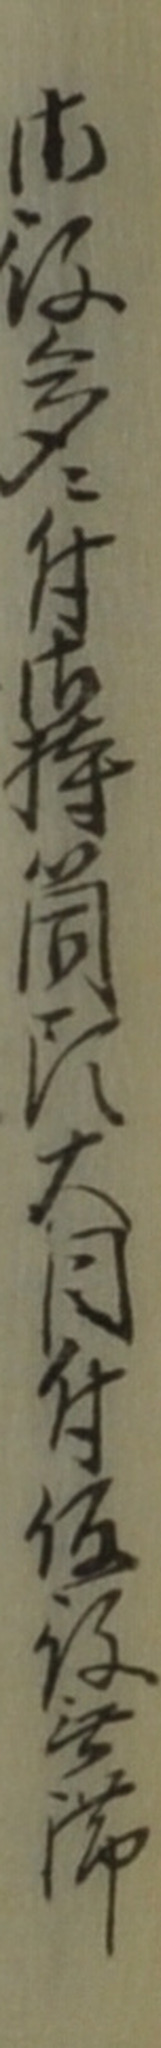御役多ニ付御持筒頭大目付仮役無滞
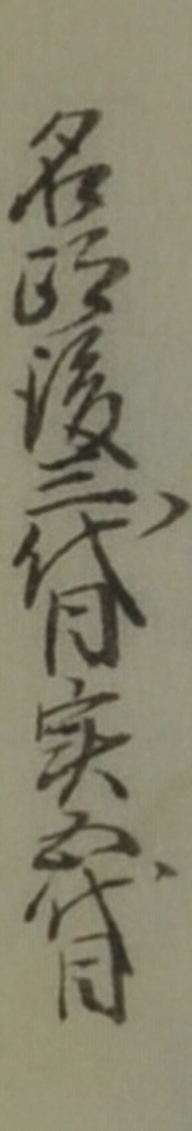名跡後三代目実五代目
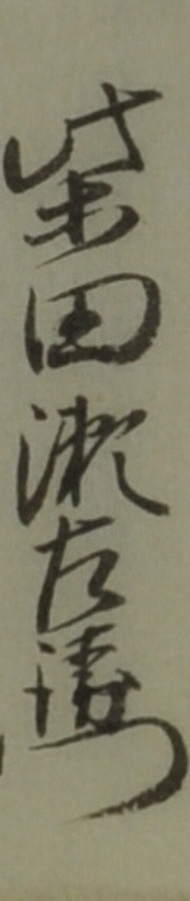柴田瀬左衛門
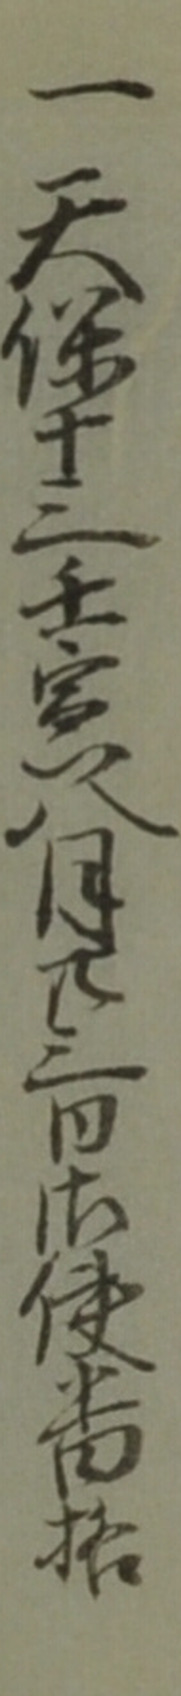一天保十三壬寅八月廿三日御使番格
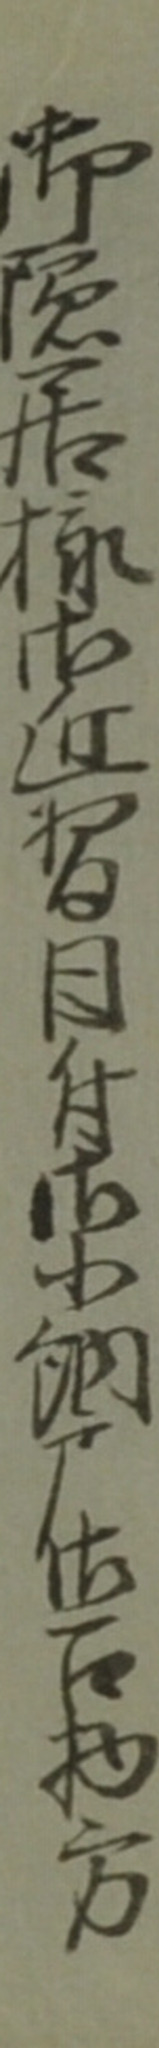御隠居様御近習目付御小納戸御召物方
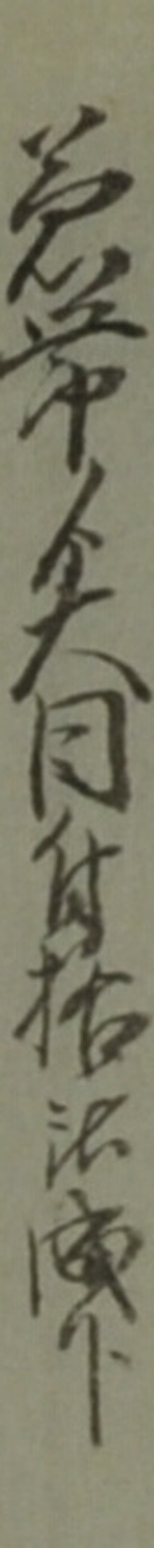兼帯ゟ大目付格被成下
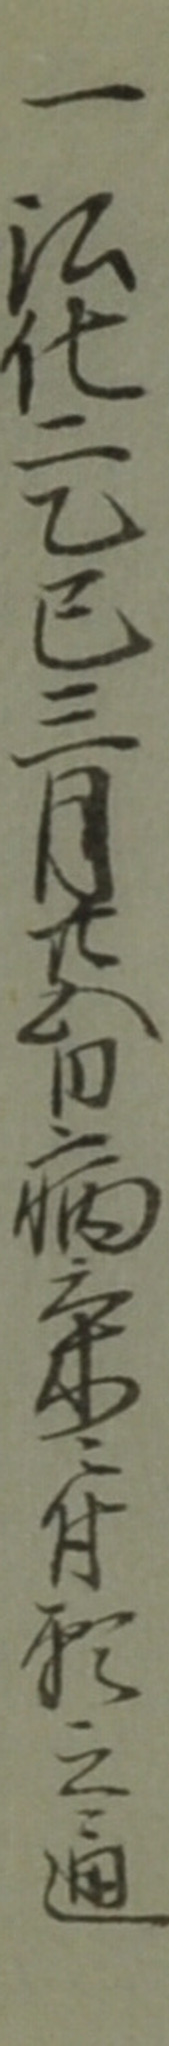一弘化二乙巳三月廿五日病気ニ付願之通
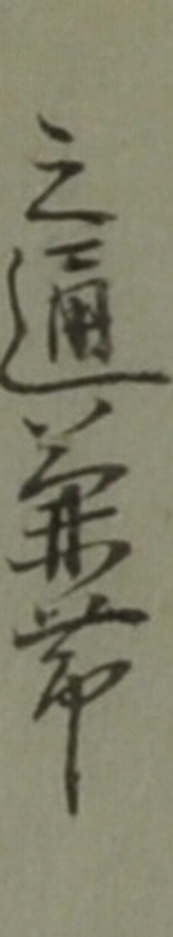之通兼帯
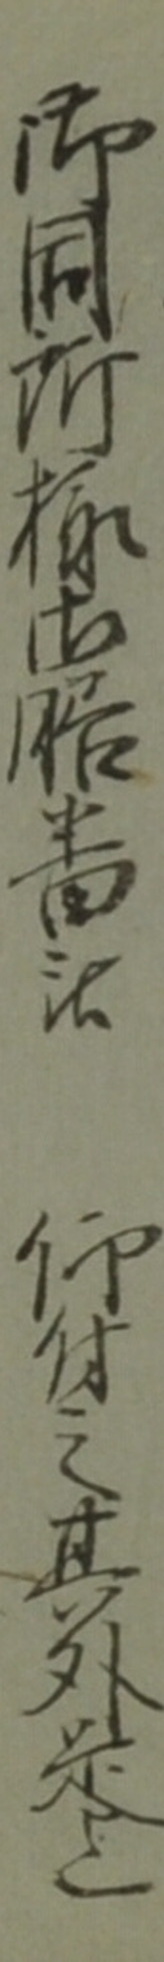御同所様御膳番被仰付之其外是迄
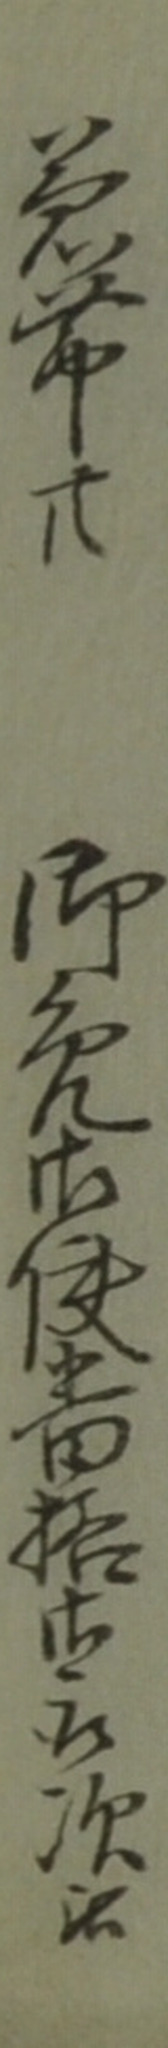兼帯共御免御使番格御取次被
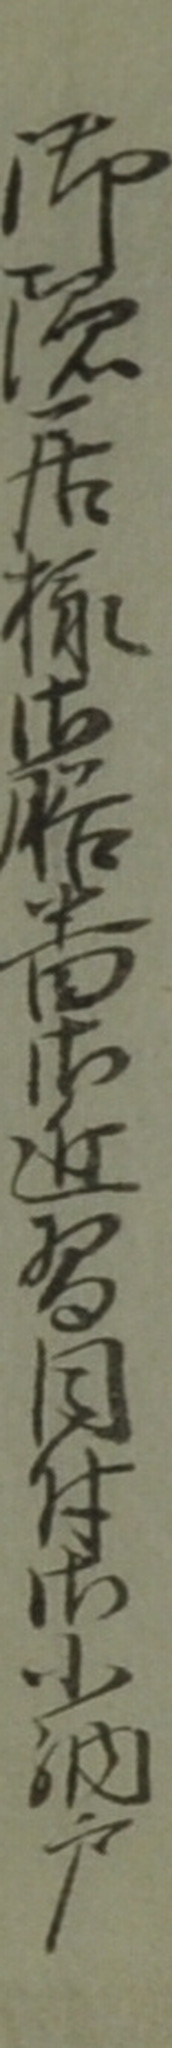御隠居様御膳番御近習目付御小納戸
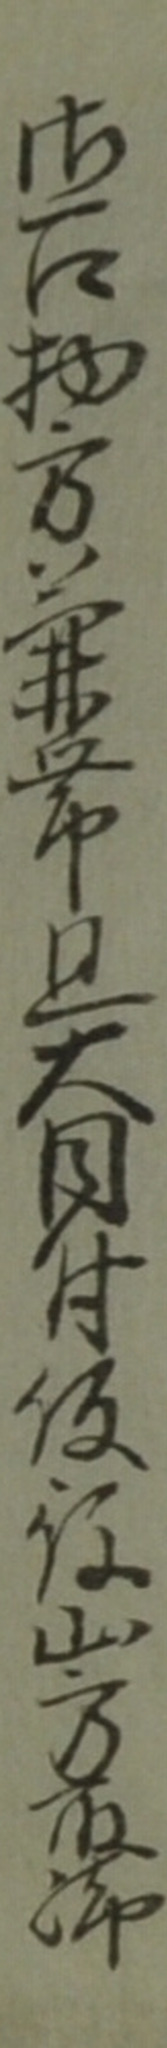御召物方兼帯且大目付仮役山方取締
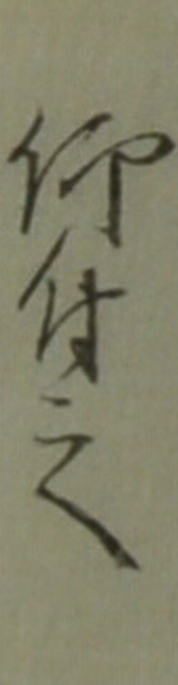仰付之
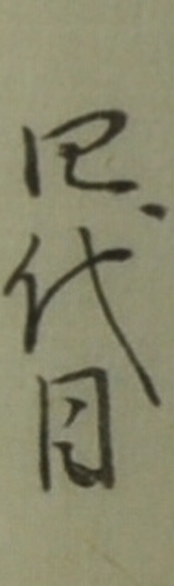四代目

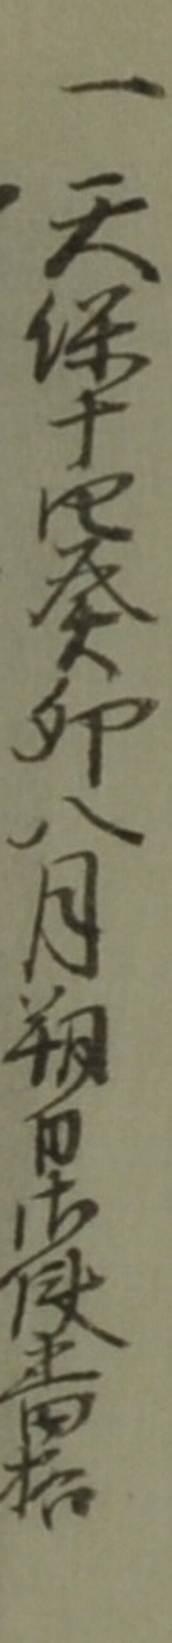一天保十四癸卯八月朔日御使番格
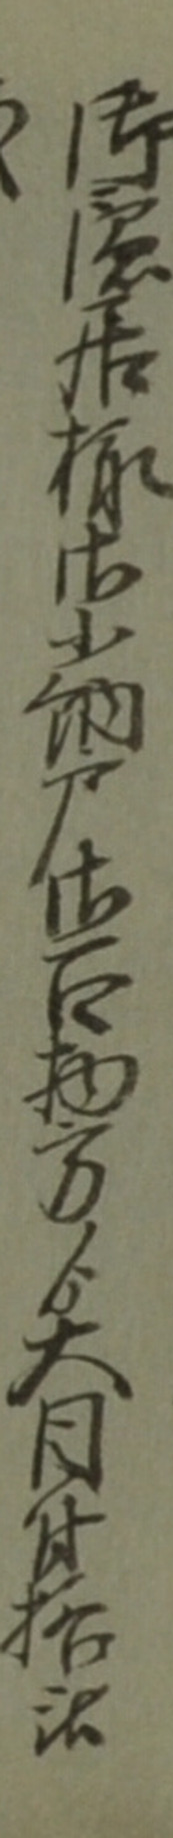御隠居様御小納戸御召物方ゟ大目付格被
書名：諸御役代々録（四）
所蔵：伊那市立高遠町図書館・合同会社AMANE
